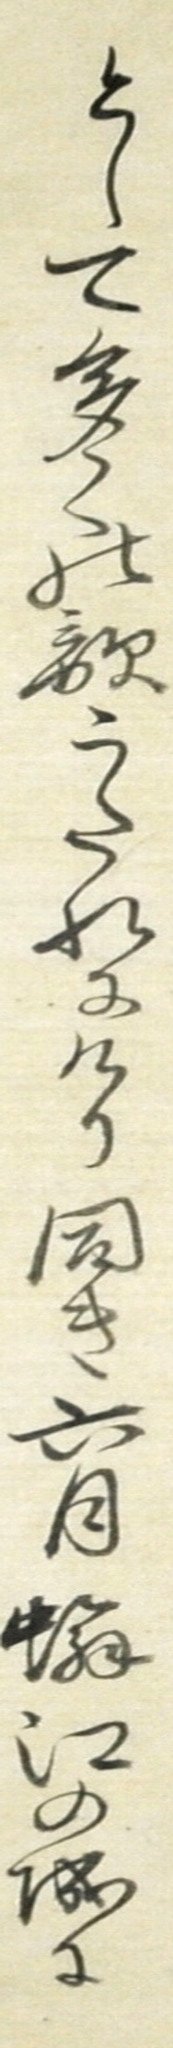として多くの敵うたれにけり同き六月蟹江の城に
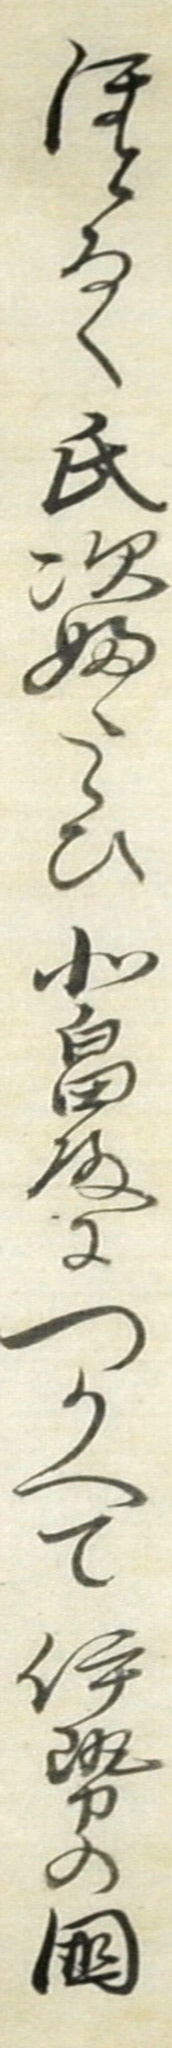ほとなく氏次ふたゝひ北畠殿につかへて伊勢の国
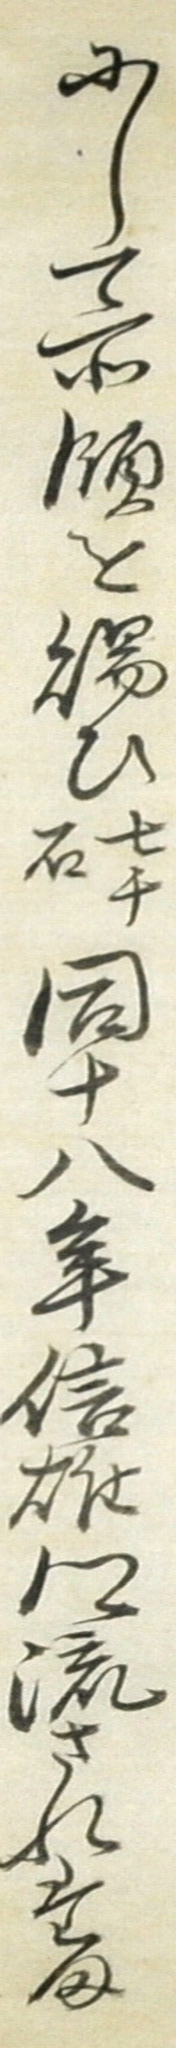にして所領を賜ひ七千石同十八年信雄卿流されたま
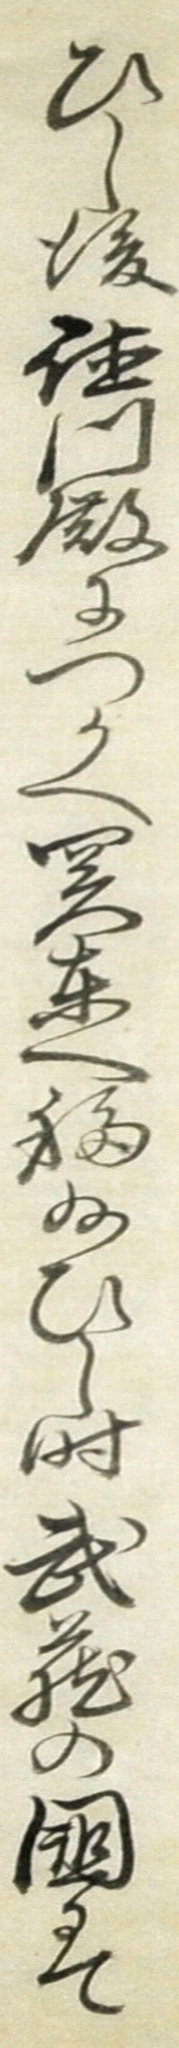ひし後徳川殿につかへ関東へ移給ひし時武蔵の国にて
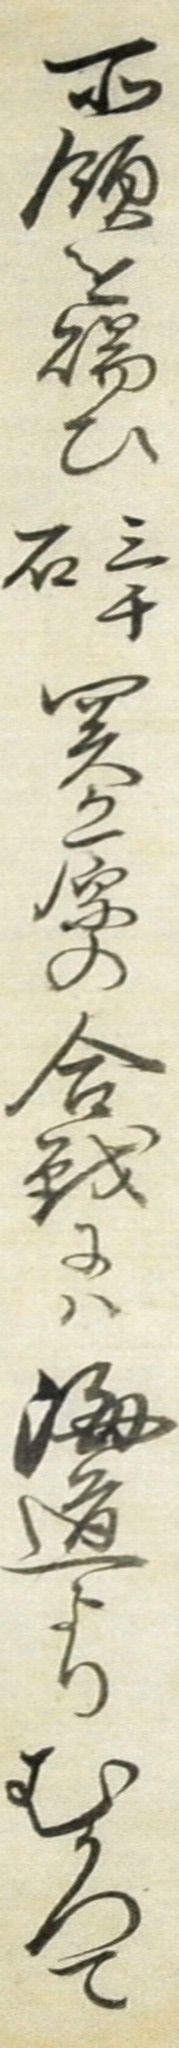所領を賜ひ三千石関ヶ原の合戦には海道よりむかつて
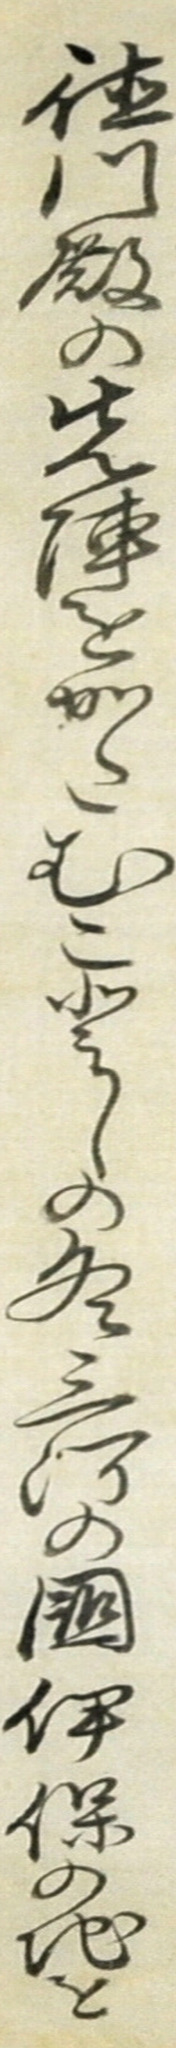徳川殿の先陣をかたむことしの冬三河の国伊保の地を
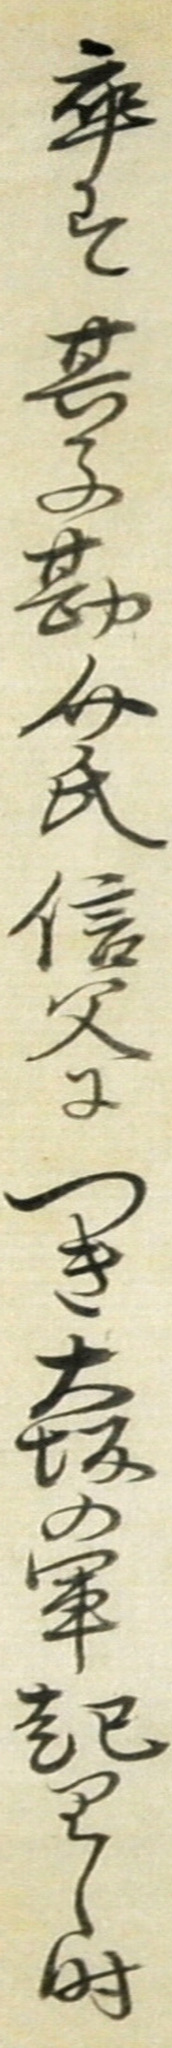卒す其子勘介氏信父につき大坂の軍起りし時
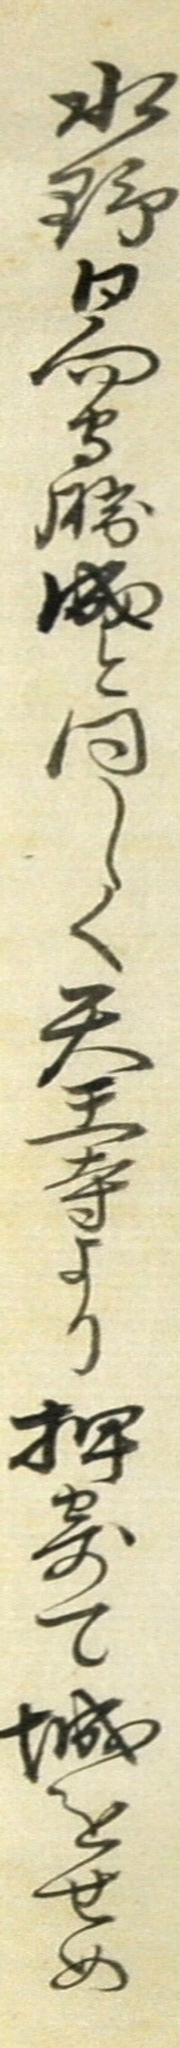水野日向守勝成と同しく天王寺より押寄て城をせめ

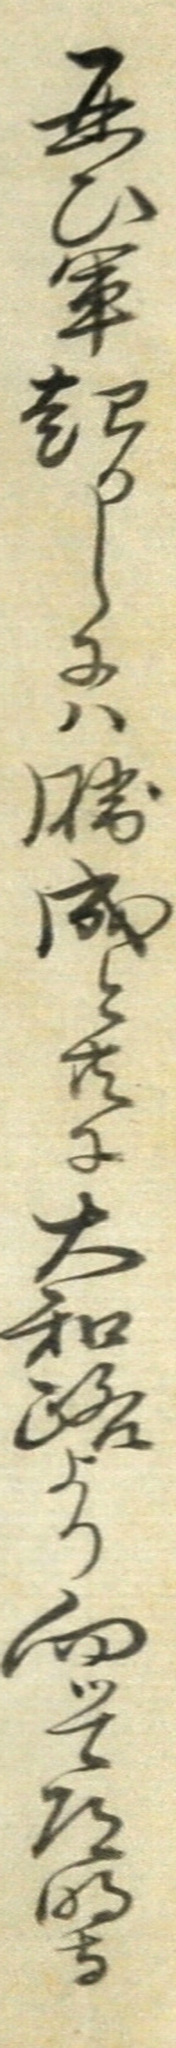再ひ軍起りしには勝成と共に大和路より向ッて道明寺
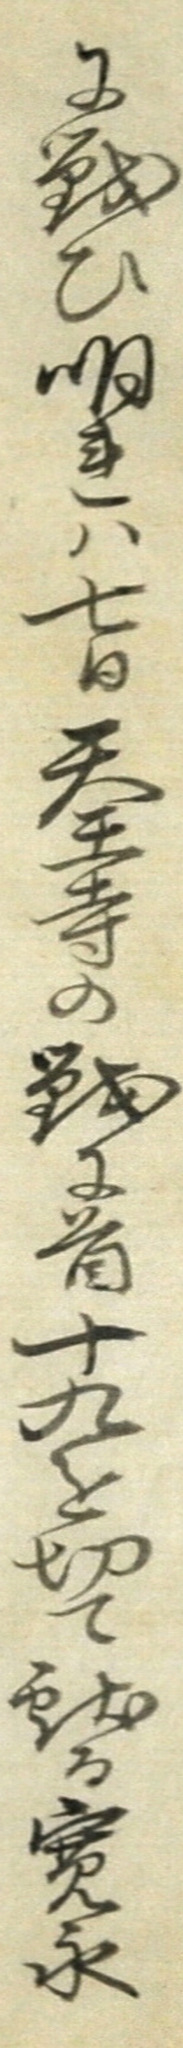に戦ひ明れは七日天王寺の戦に首十九を切て献る寛永
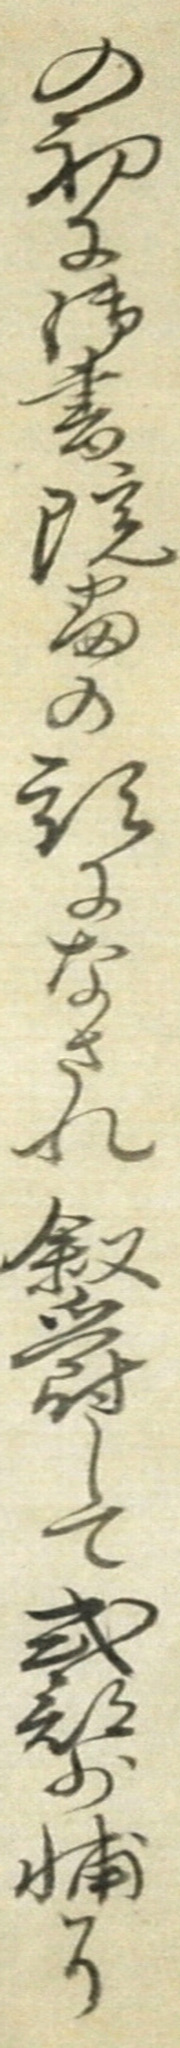の初に御書院番の頭になされ叙爵して式部少輔に
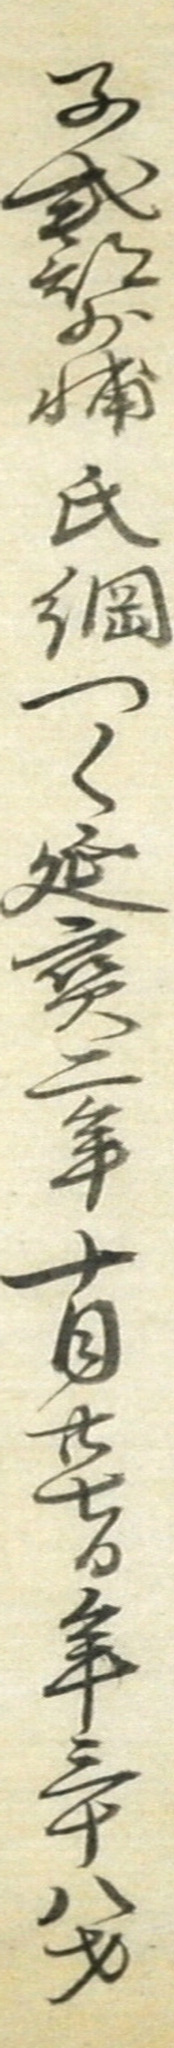子式部少輔氏綱つく延宝二年十月廿七日年三十八才
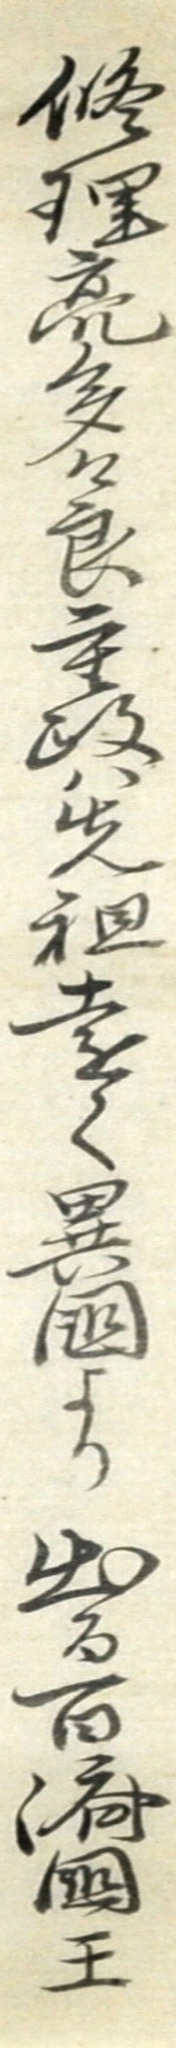修理亮多々良重政は先祖遠く異国より出る百済国王
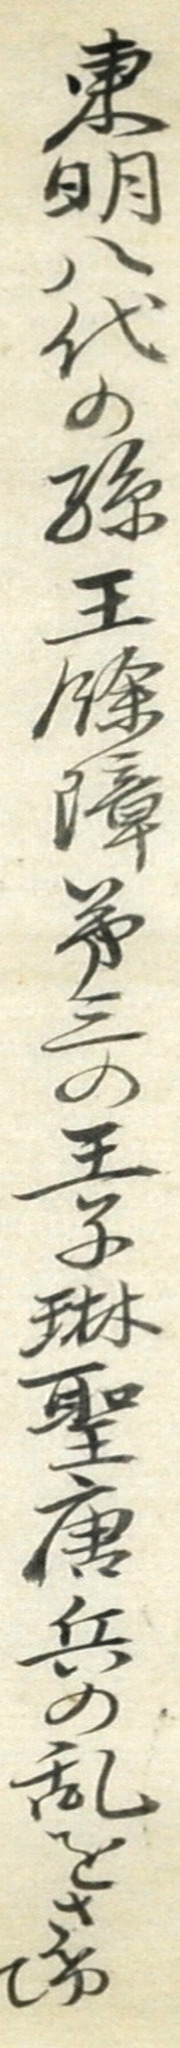東明八代の孫王余障第三の王子琳聖唐兵の乱をさけて
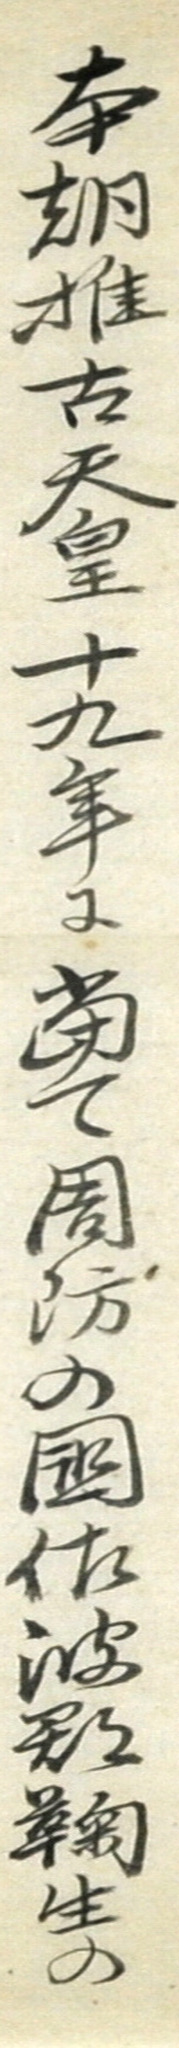本朝推古天皇十九年に当て周防の国佐波郡鞠生の
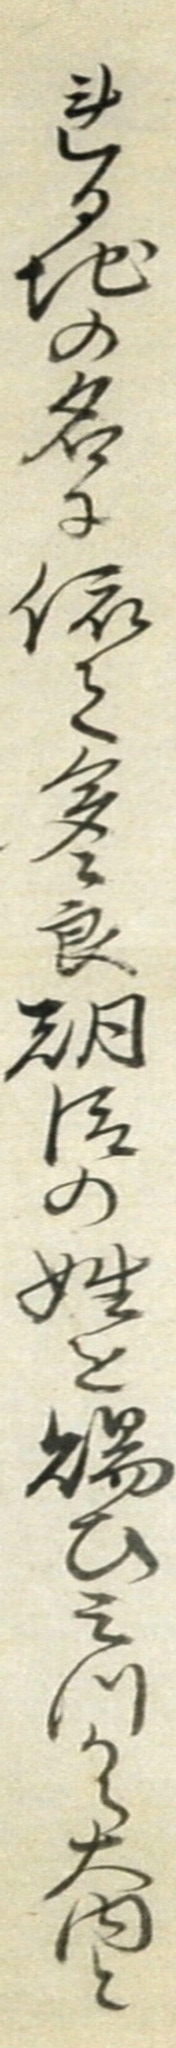れる地の名に依て多々良朝臣の姓を賜ひみつから大内と
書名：藩翰譜（六）
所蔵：伊那市立高遠町図書館・合同会社AMANE
